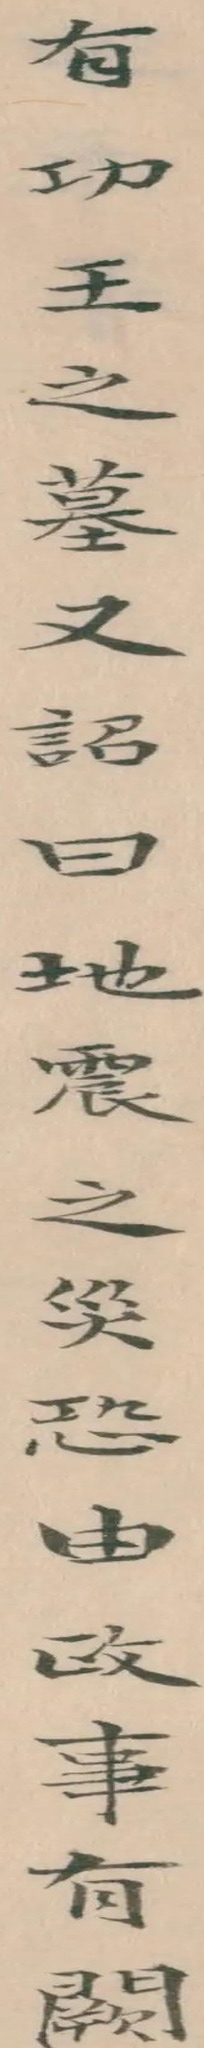有功王之墓又詔曰地震之災恐由政事有闕
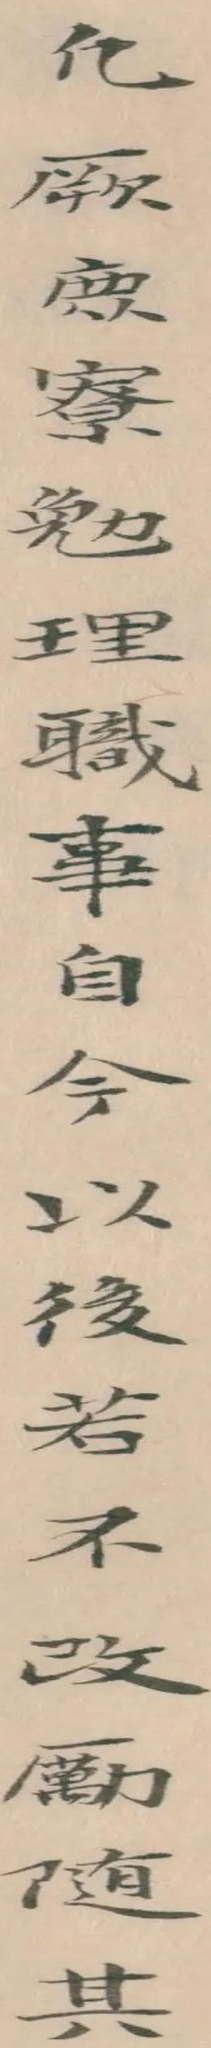凡厥庶寮勉理職事自今以後若不改励随其
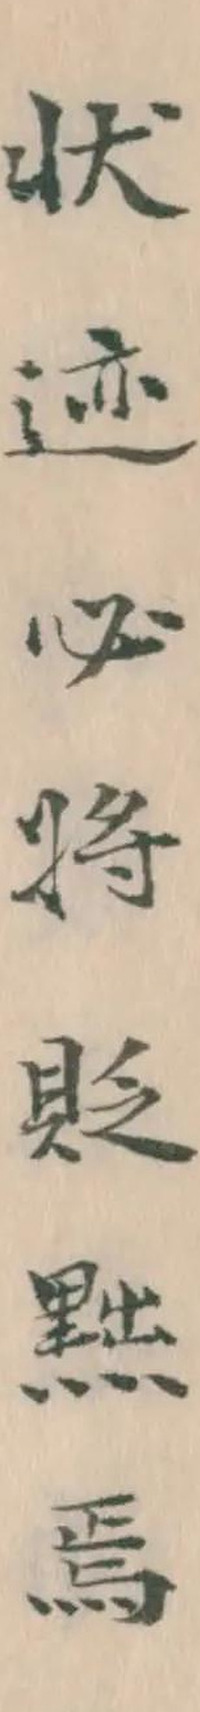状跡必将貶黜焉
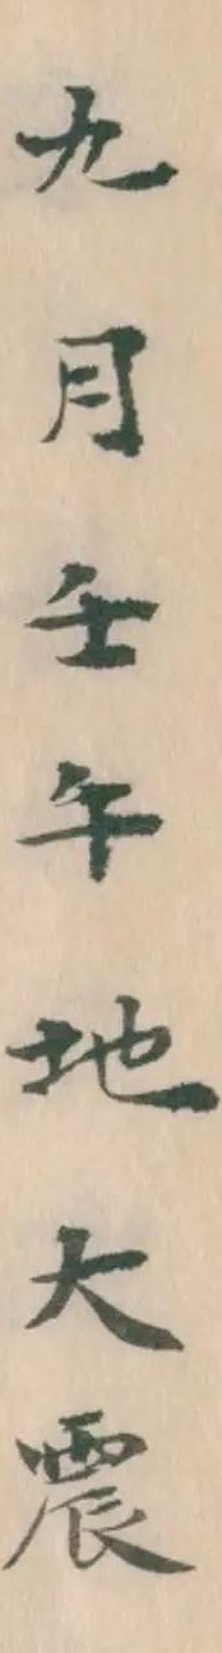九月壬午地大震
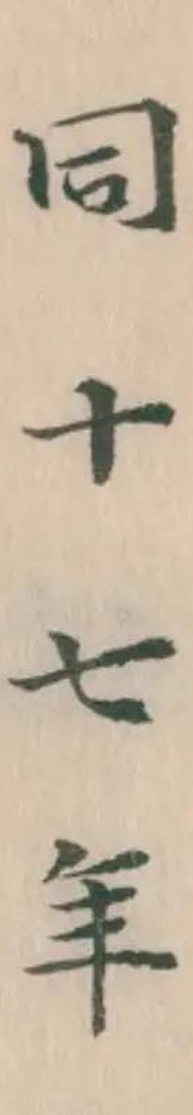同十七年
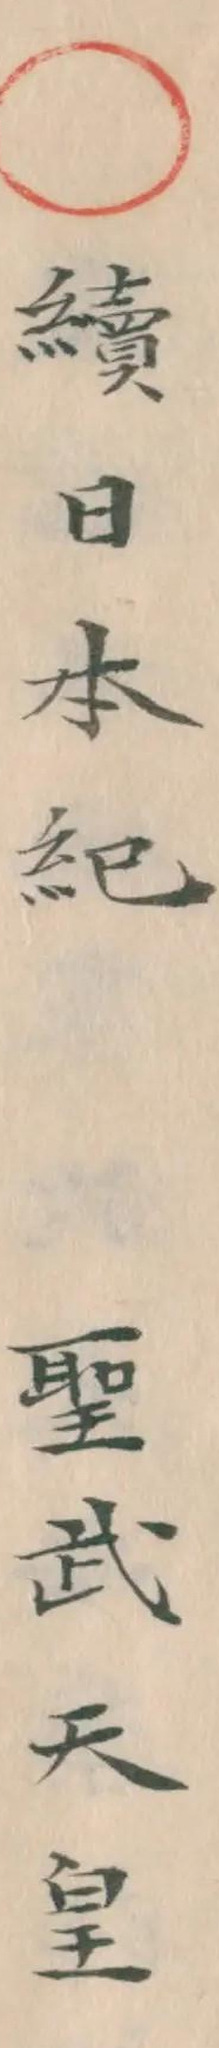○続日本紀聖武天皇
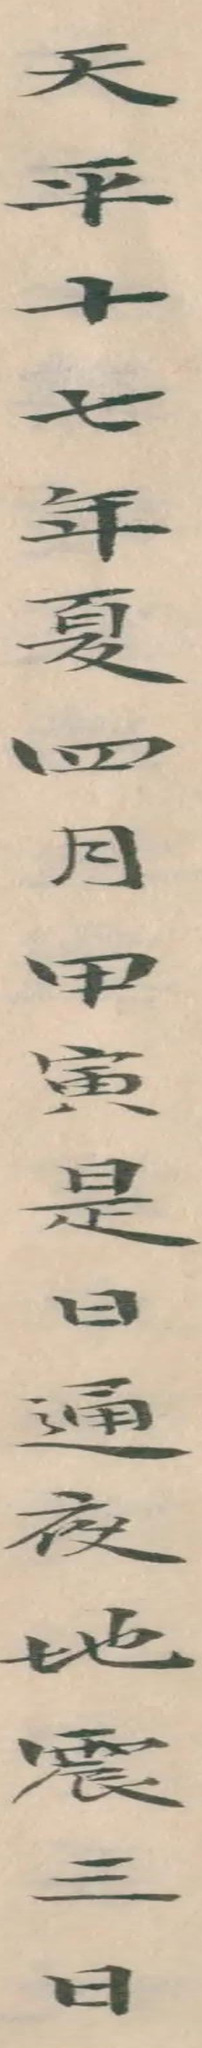天平十七年夏四月甲寅是日通夜地震三日

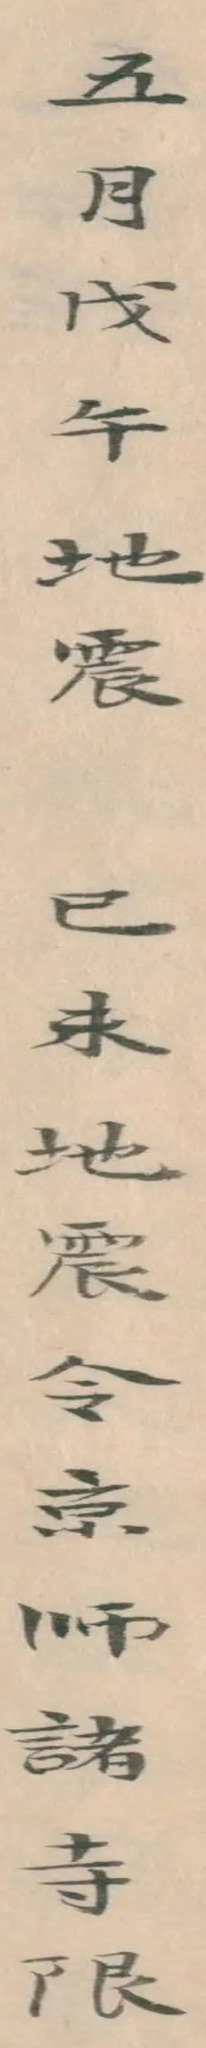五月戊午地震已未地震令京師諸寺限
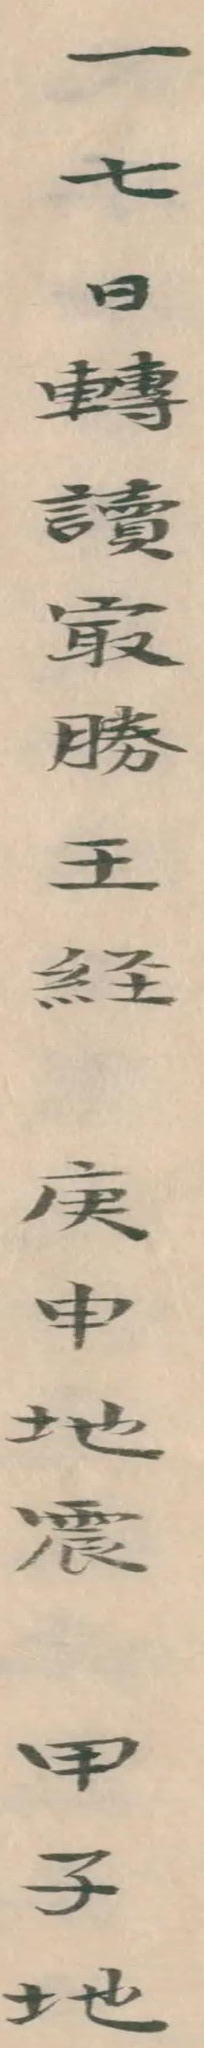一七日転読最勝王経庚申地震甲子地
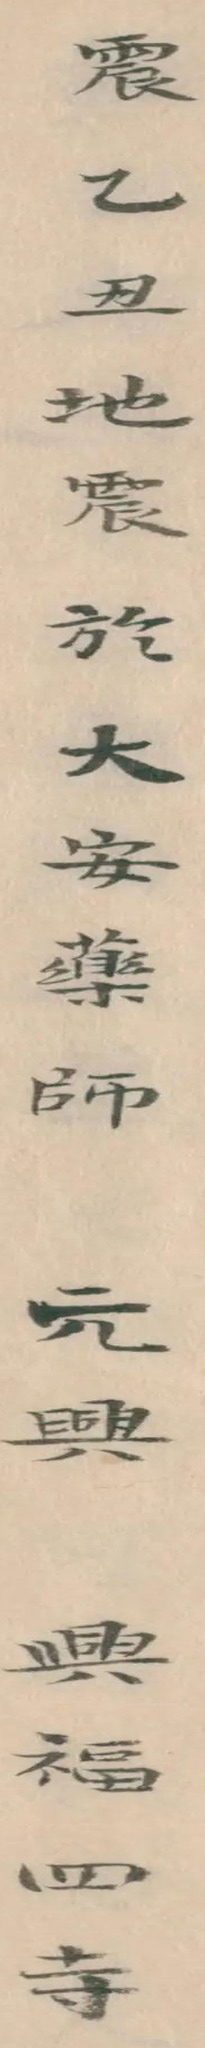震乙丑地震於大安薬師元興興福四寺
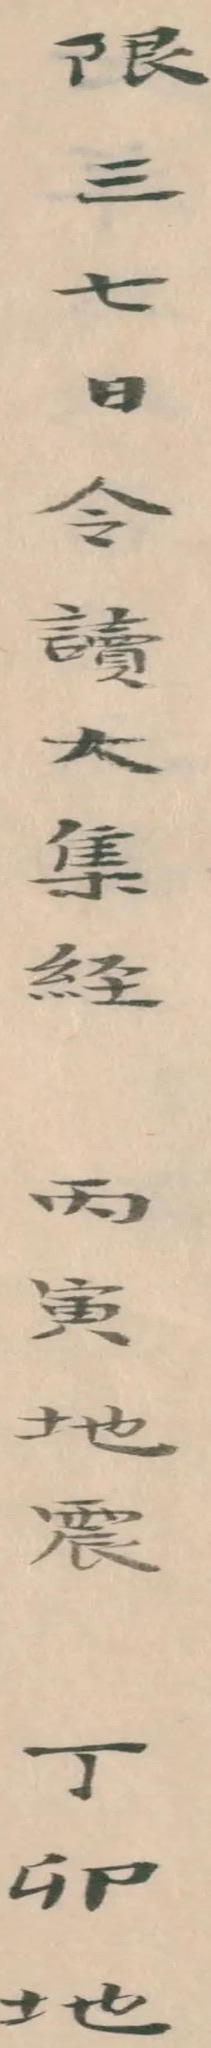限三七日令読大集経丙寅地震丁卯地
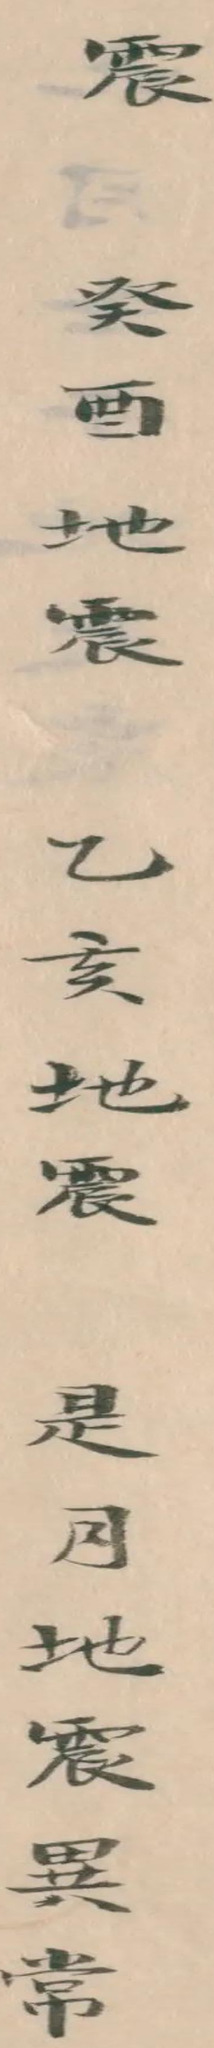震癸酉地震乙亥地震是月地震異常
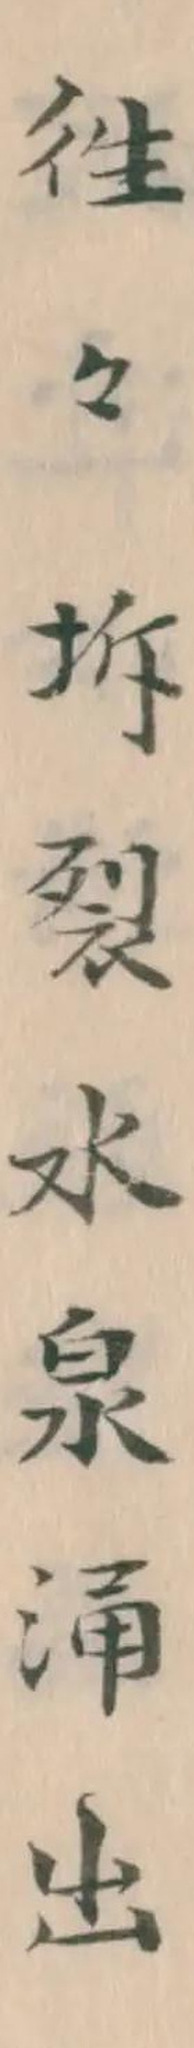往々折裂水泉涌出
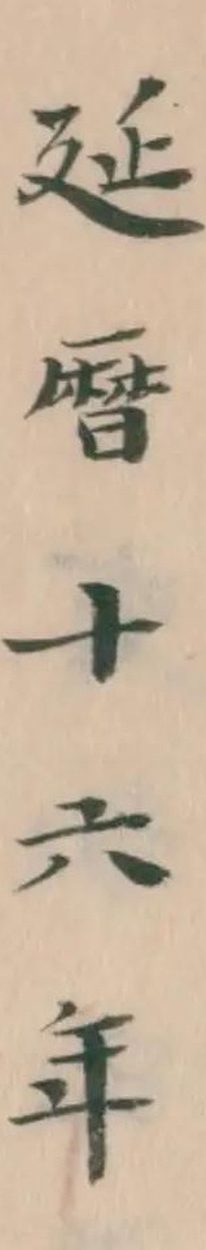延暦十六年
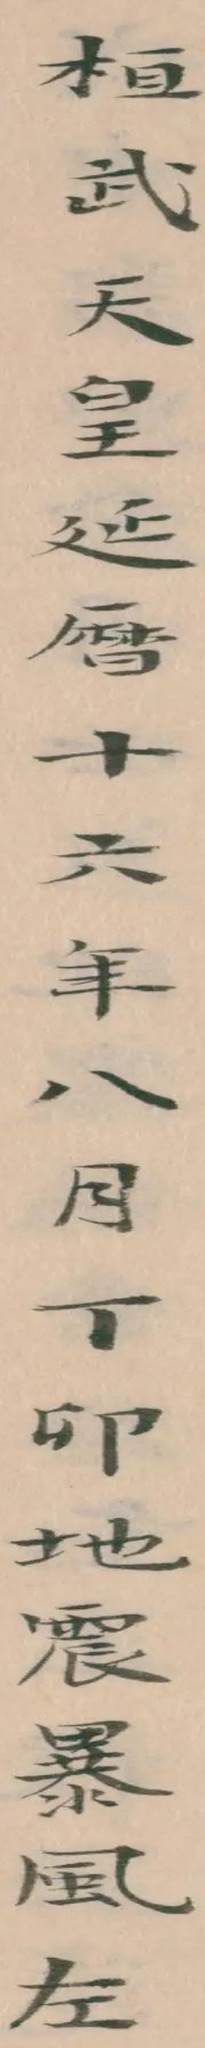桓武天皇延暦十六年八月丁卯地震暴風左
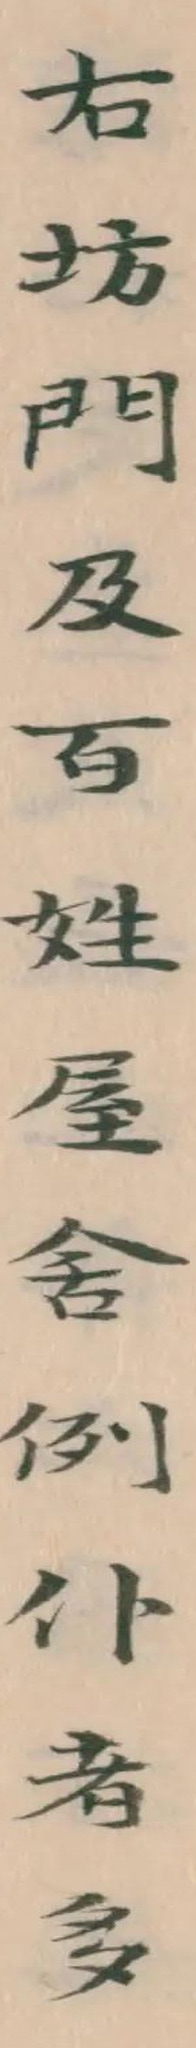右坊門及百姓屋舎例仆者多
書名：地災撮要. 巻5-6(地震之部)
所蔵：国立国会図書館 National Diet Library, JAPAN
